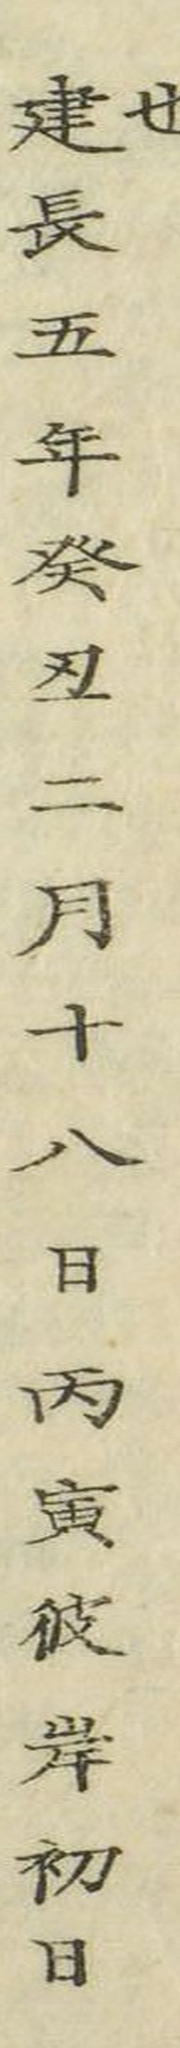建長五年癸丑二月十八日丙寅彼岸初日

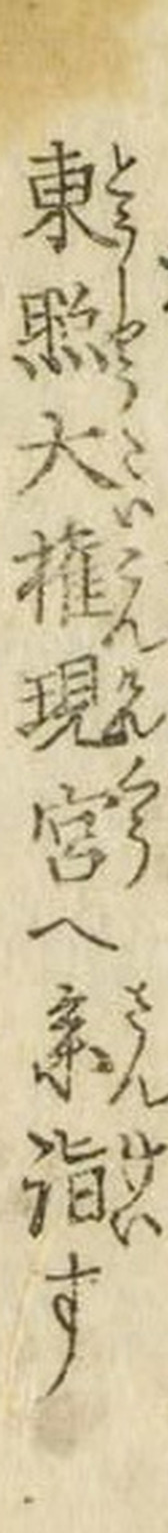東照大権現宮へ参詣す
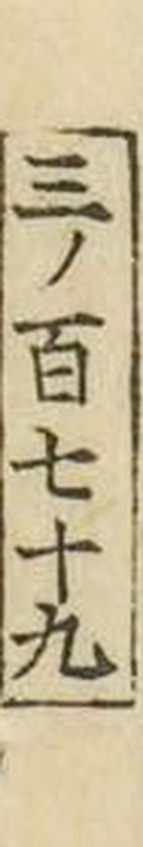三ノ百七十九
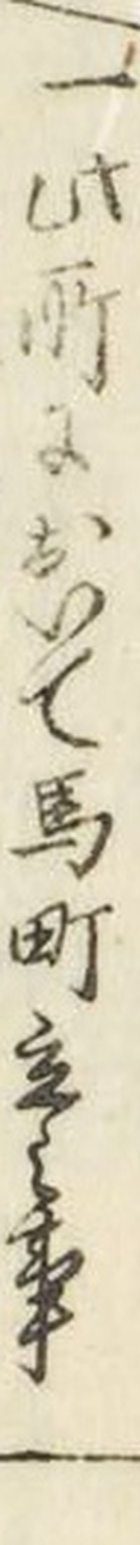一此所において馬町立之事
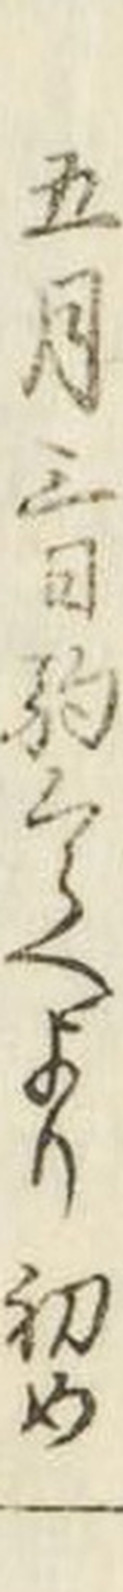五月三日駒くらへより初め
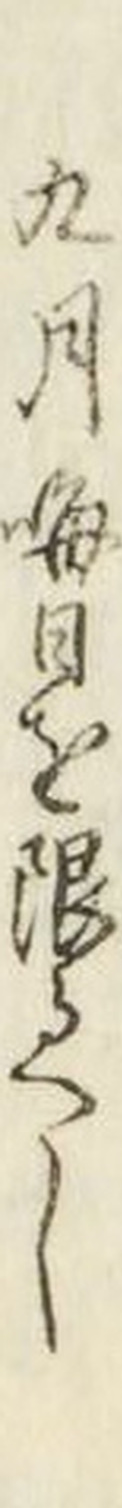九月晦日を限るへし
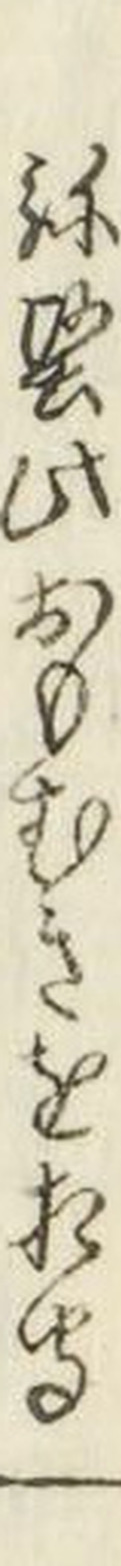称堅此おもむきを相守
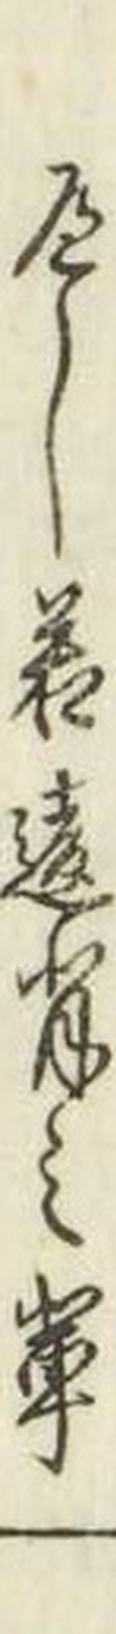へし若違背之輩
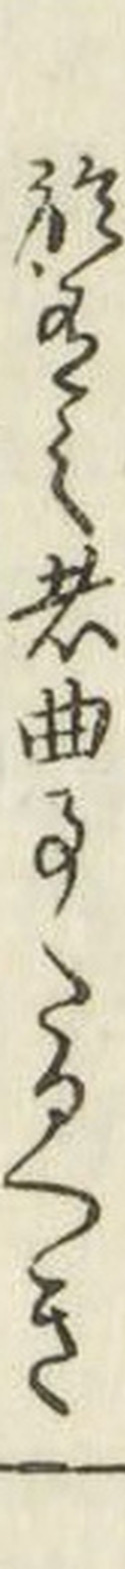於有之者曲事たるへき
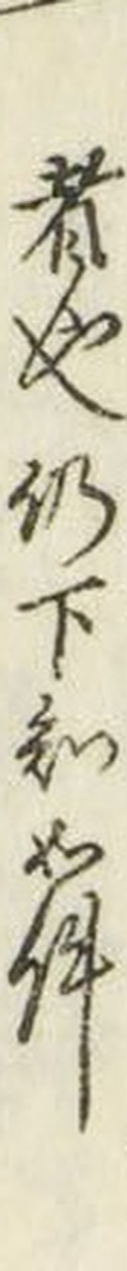者也仍下知如件

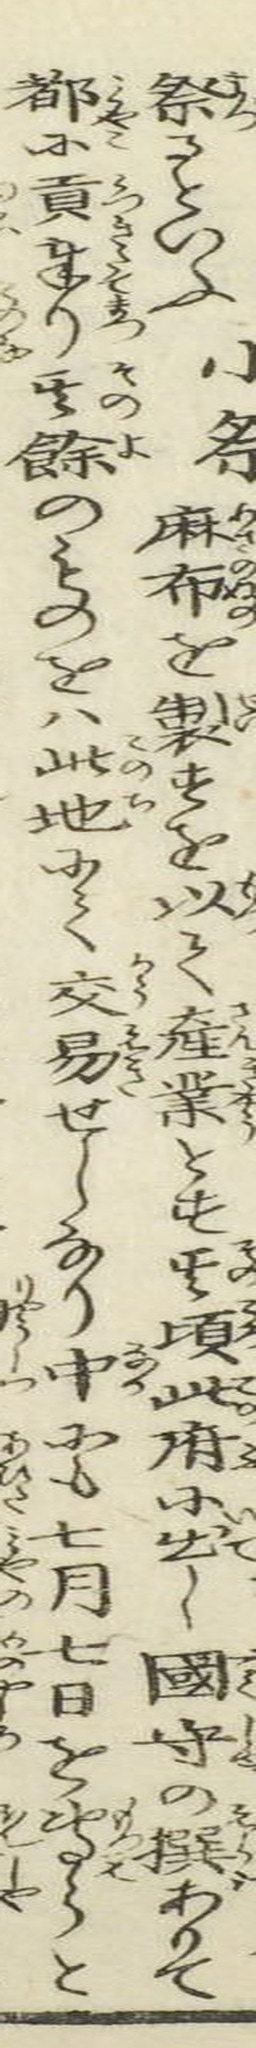都に貢奉り其余のものをは此地にて交易せしなり中にも七月七日を専らと
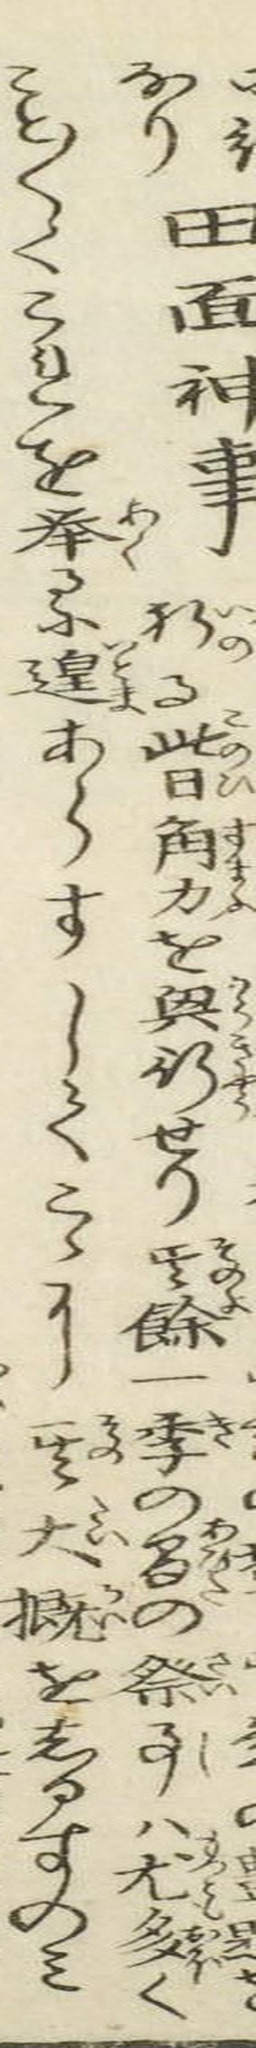こと〳〵くこれを挙るに遑あらすしてこゝに其大概をしるすのみ
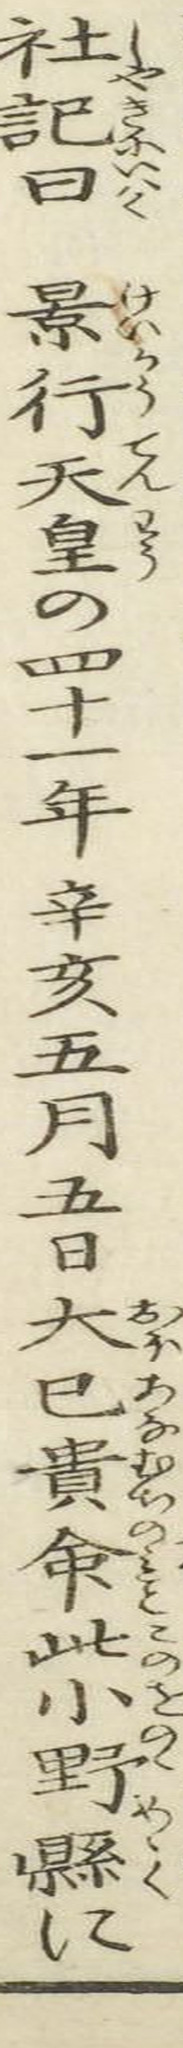社記曰景行天皇の四十一年辛亥五月五日大巳貴命此小野県に
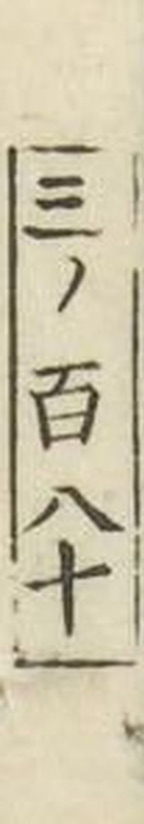三ノ百八十
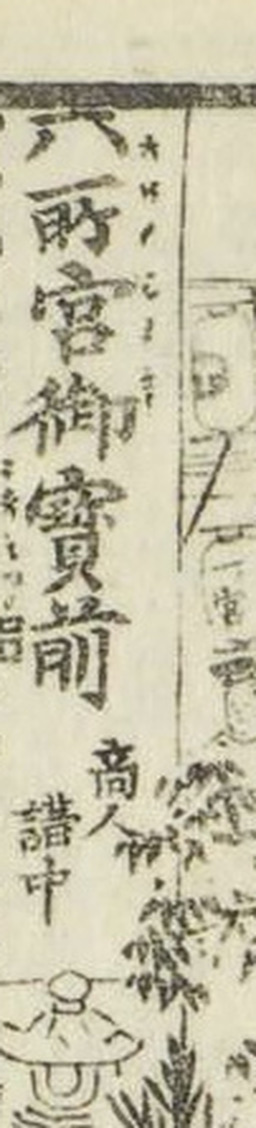六所宮御宝前商人講中

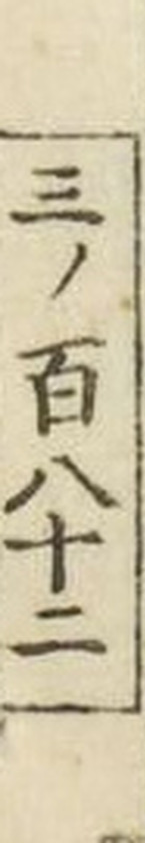三ノ百八十二
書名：江戸名所図会 20巻 巻之10
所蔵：東京学芸大学教育コンテンツアーカイブ
